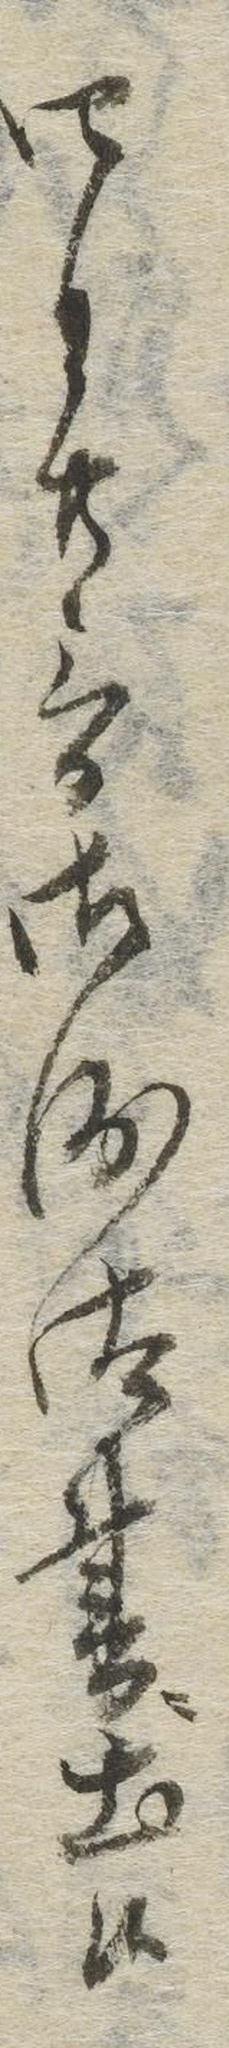四月廿三日御沙汰書二出候
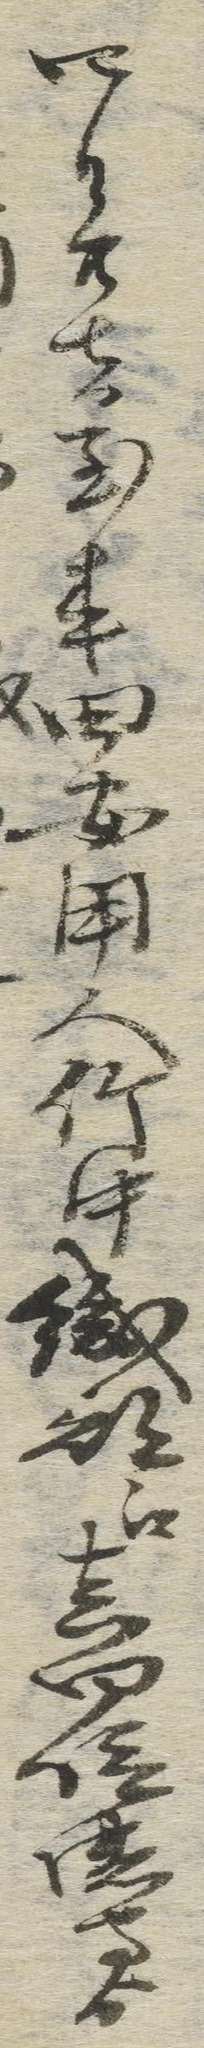四月廿七日到来田安用人竹中織部江真田信濃守ゟ
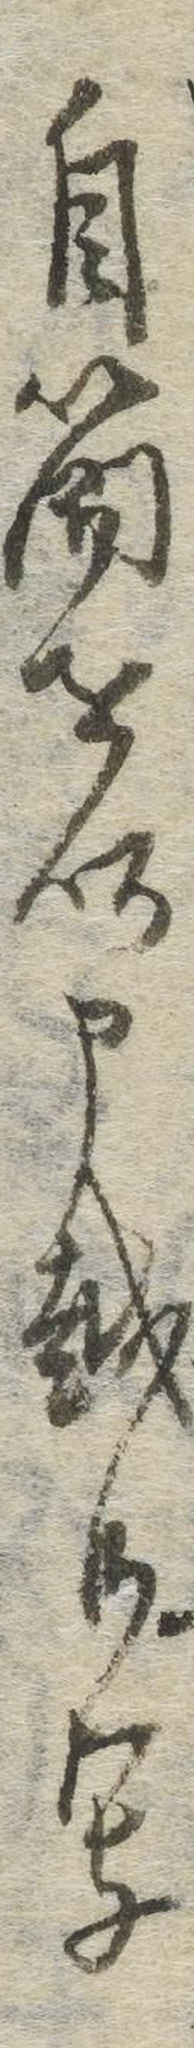自簡を以申越候写
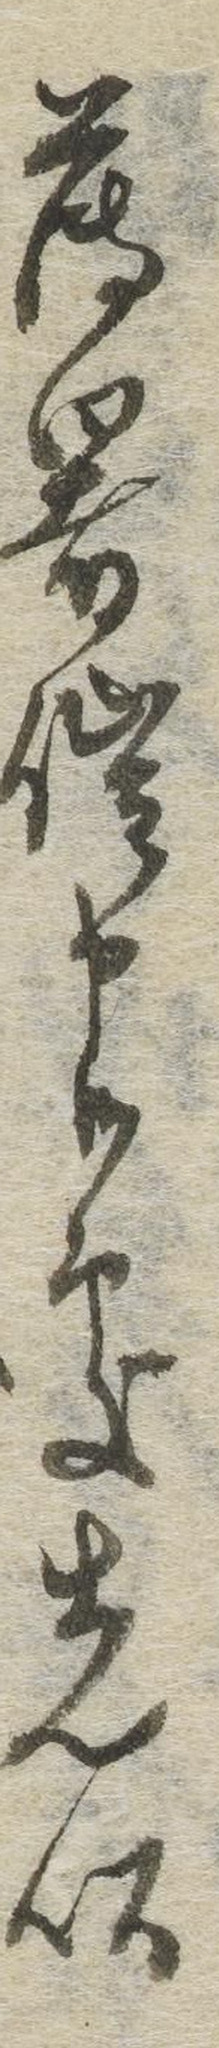厳暑催申候処先以
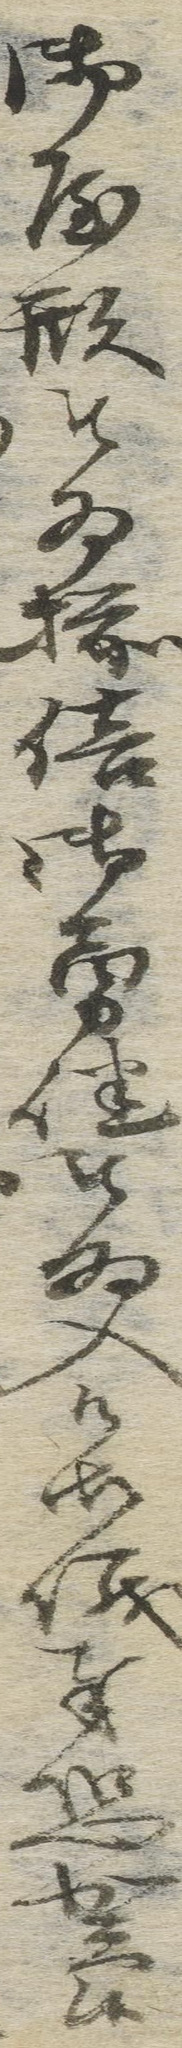御屋形被為揃増御勇健被為入候御儀奉恐賀候
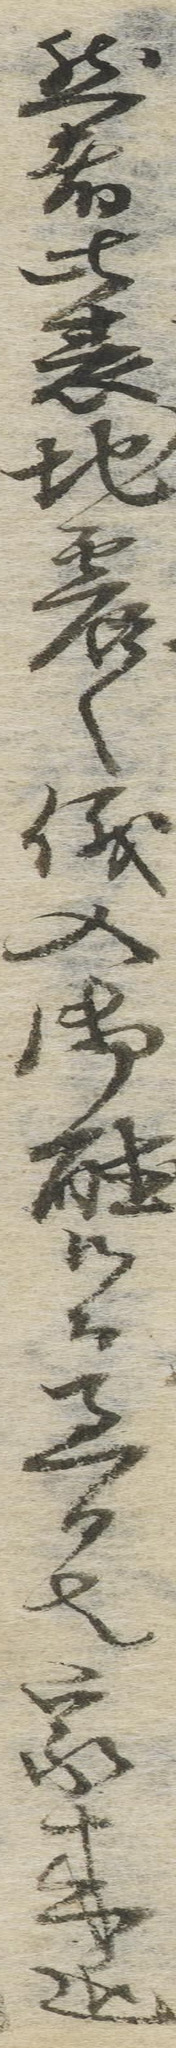然は其表地震之儀入御聴候而過日は家来迄
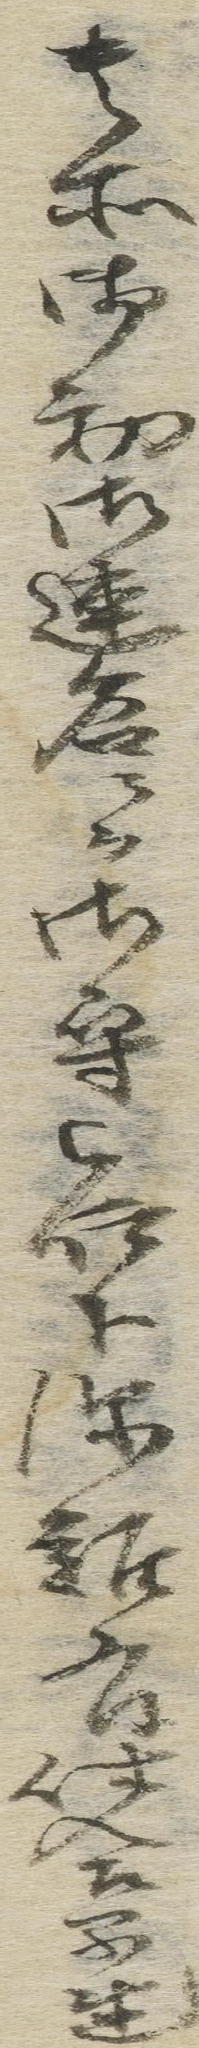貴所御初御連名二而御尋被仰下深難有仕合候早速

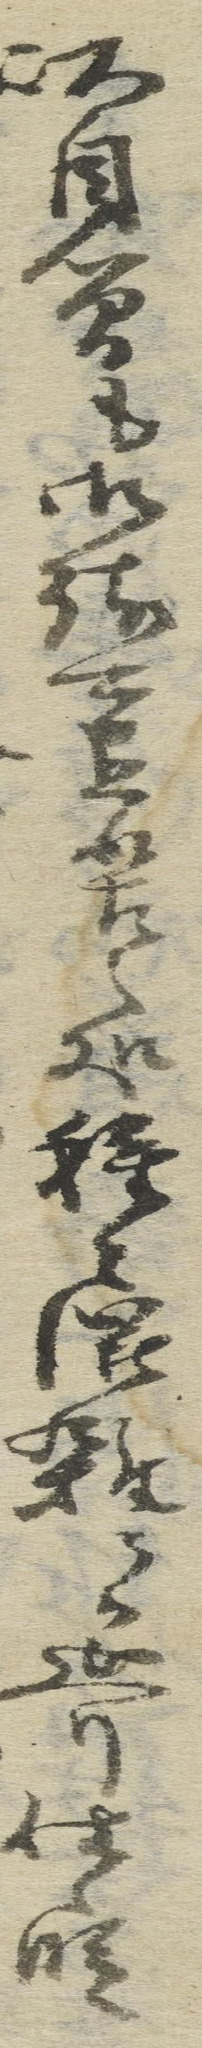以自簡も御礼可申上候左候処種々混雑二而延行仕候段
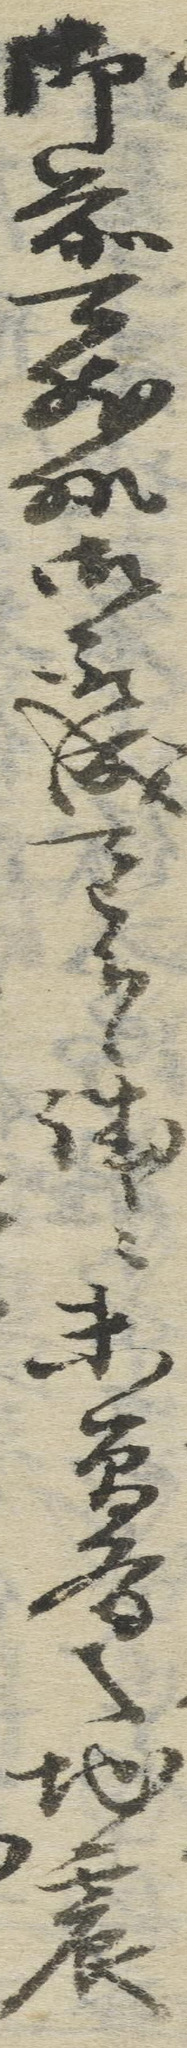御前可然様御取成可被下候体二未曾有之地震
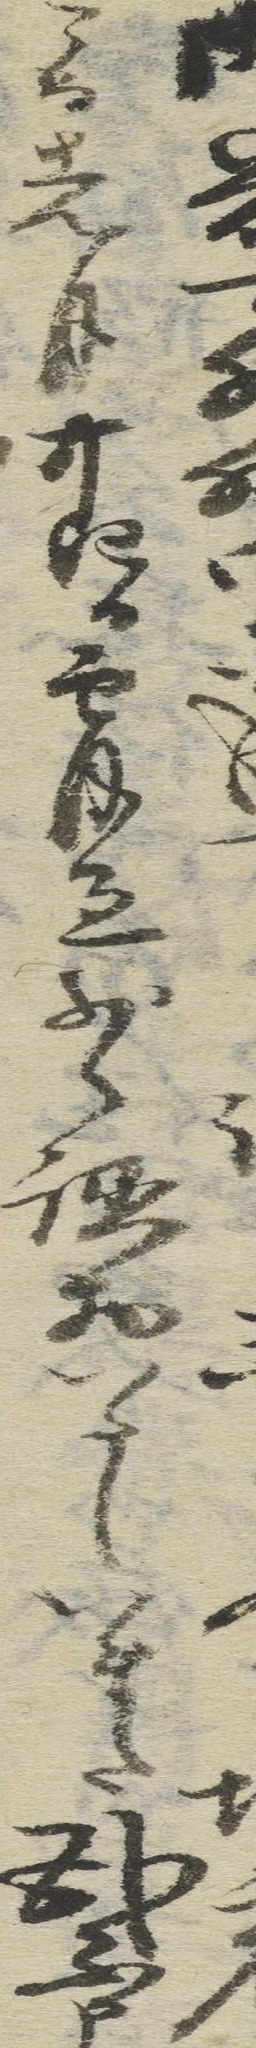二而去月廿四日宵過少々認おいていまた臥不申
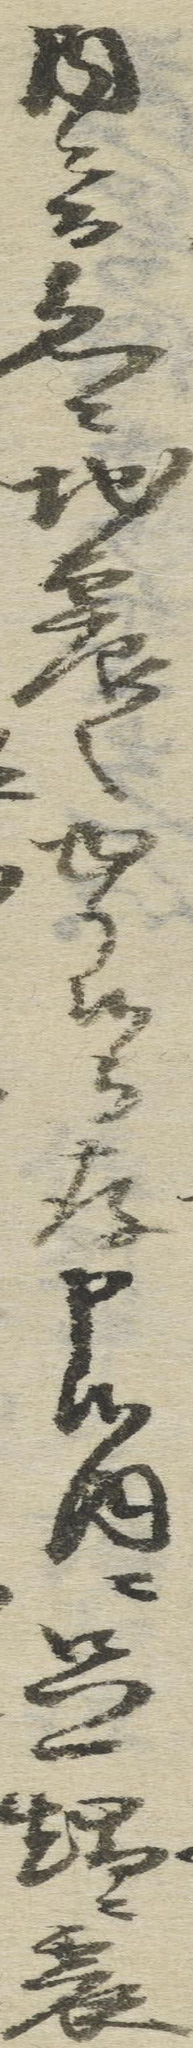内二而急二地震之ゆり候と存申候内二只一瑞二震
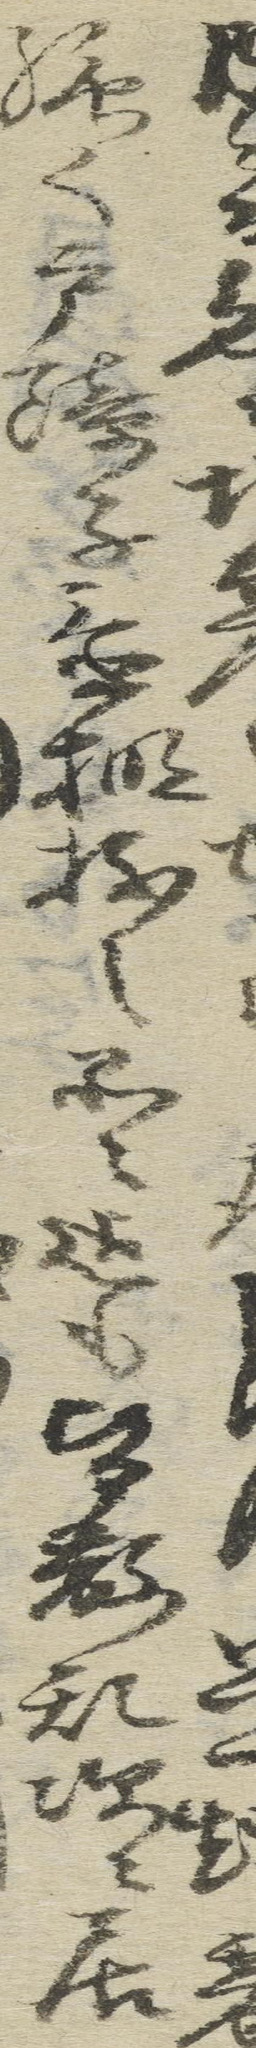強く戸障子置棚抔之品々迄も皆散乱次二居
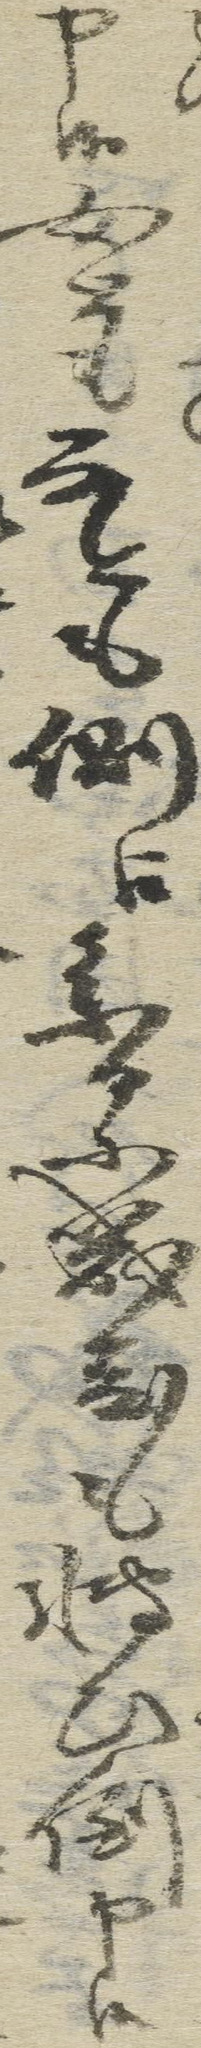申候女ともなとも側江参不成立も転ひ倒申候
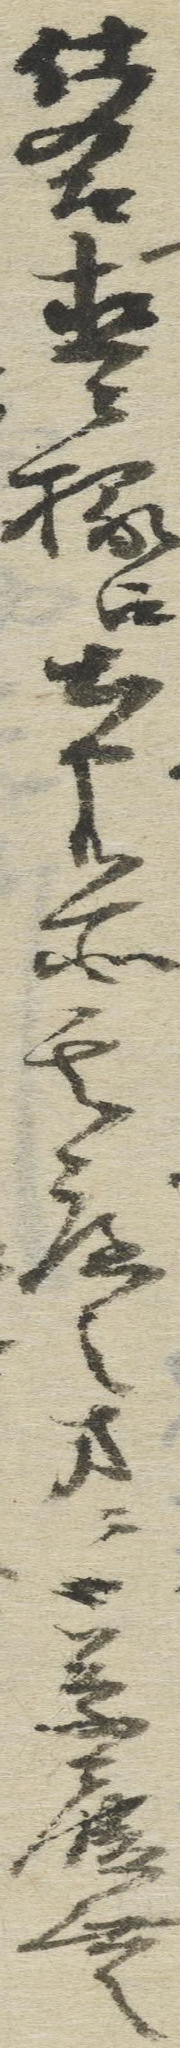仕合直二縁江出申候所其庭之方二而草履無之
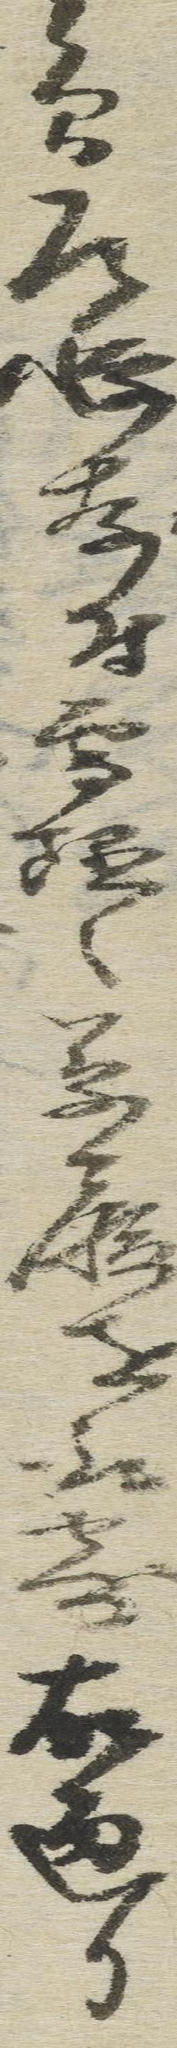候間乍転寄付雪隠之草履を取寄右通り
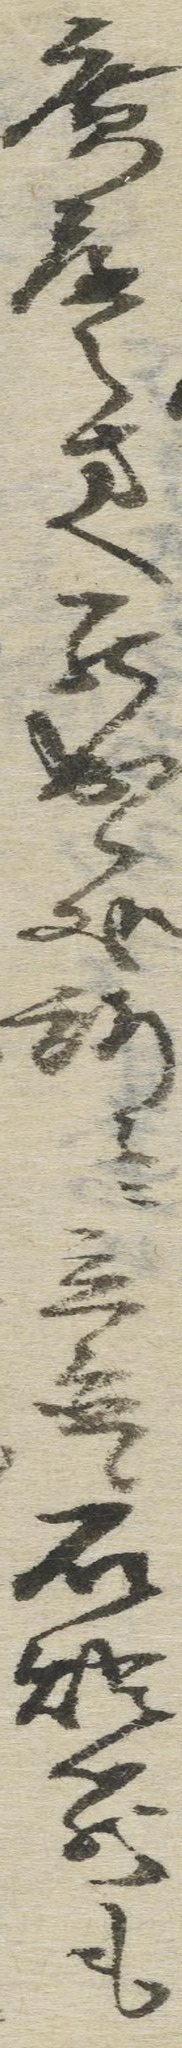廣庭之方へ罷出候処所々二立置候石燈籠も
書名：信濃越後　地震書留
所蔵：東京大学地震研究所図書室 Earthquake Research Institute Library, The University of Tokyo, JAPAN
